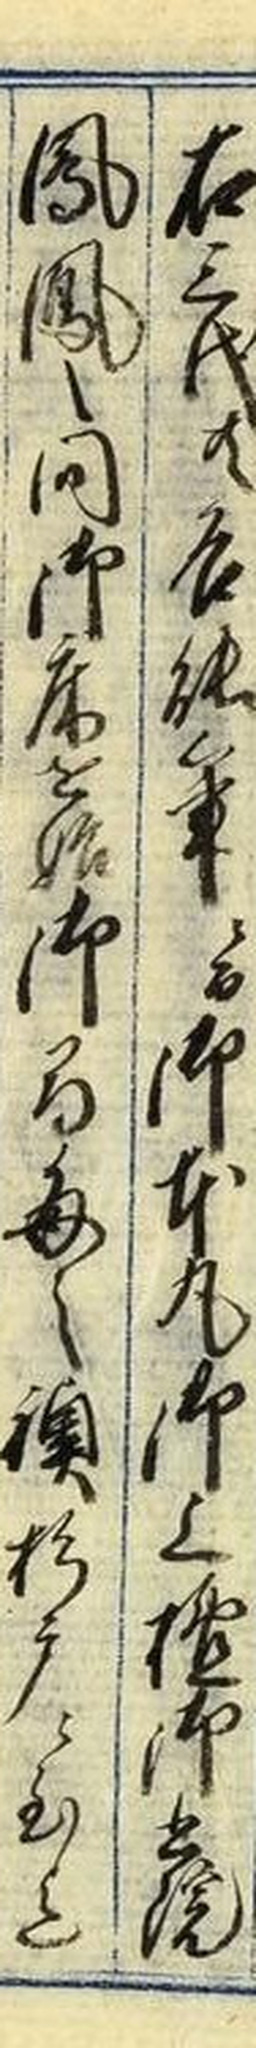鳳凰之間御床を始め御間毎之襖杉戸に至迄
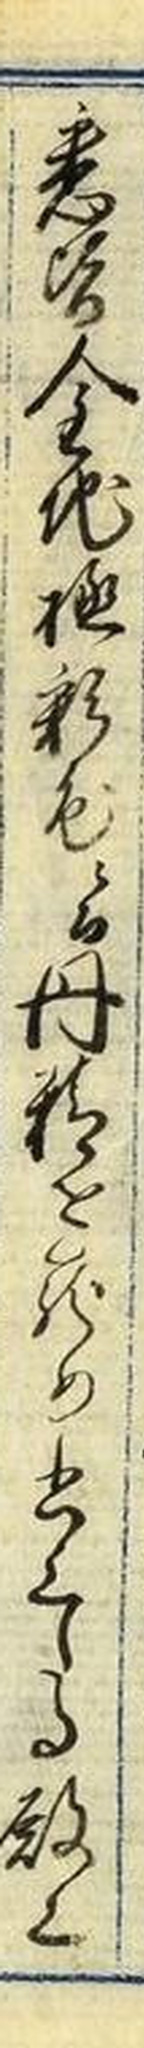悉皆金地極彩色に而丹精を籠め書上たる殿上
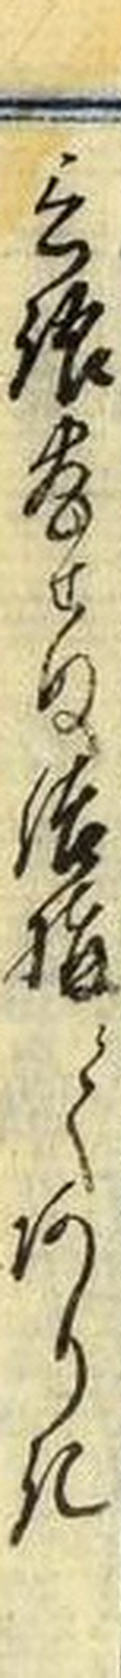言語尽せぬ結構にてありき

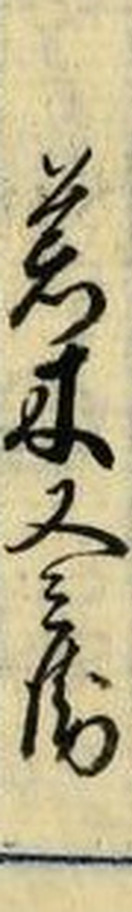荒木又兵衛
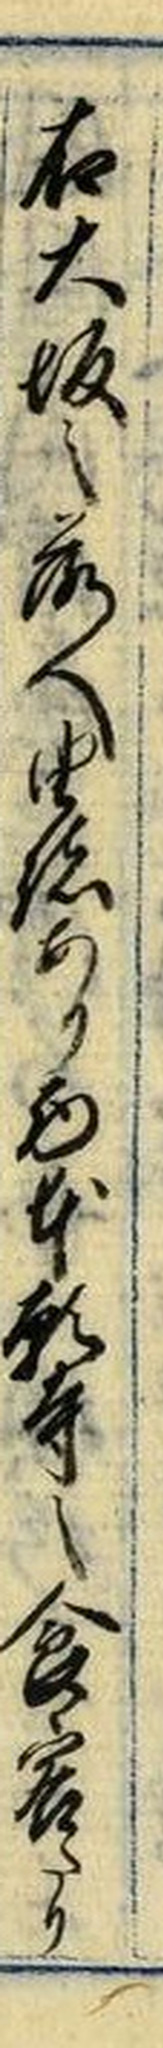右大坂之落人由緒あり西本願寺之食客たり
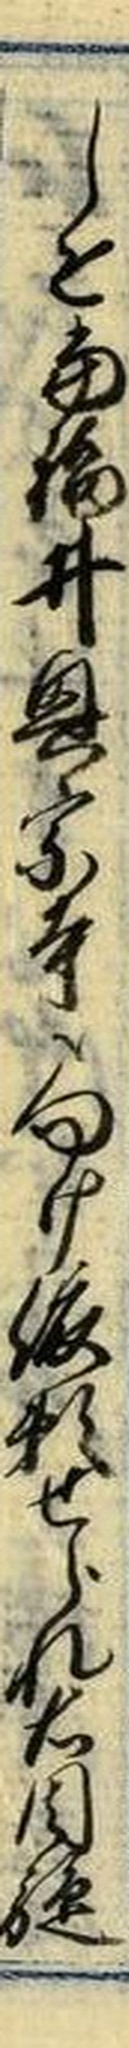しを当福井興宗寺へ向け依頼せられ右周旋
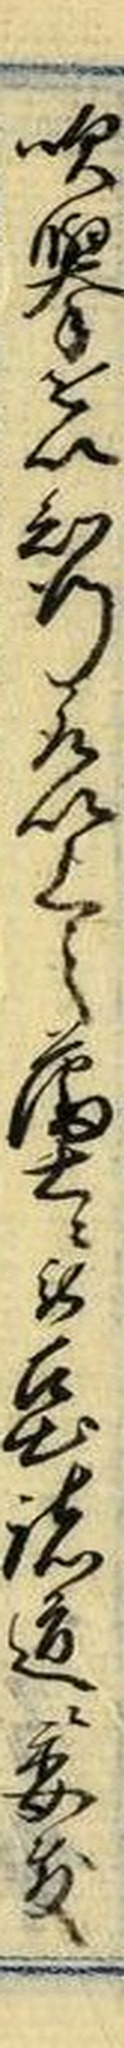吹挙を以知行取以上之藩士に被召出諸道に委敷
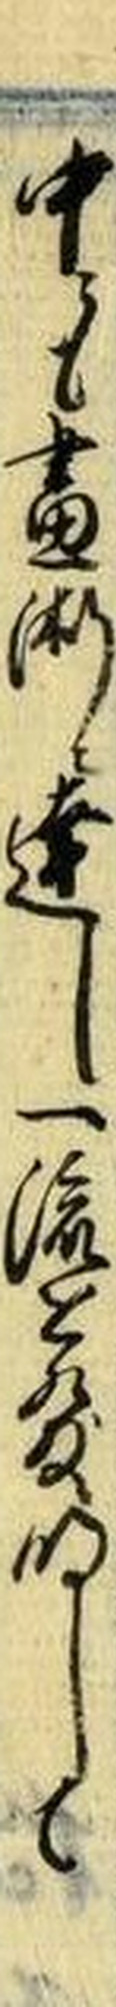中にも画術に達し一流を発明して
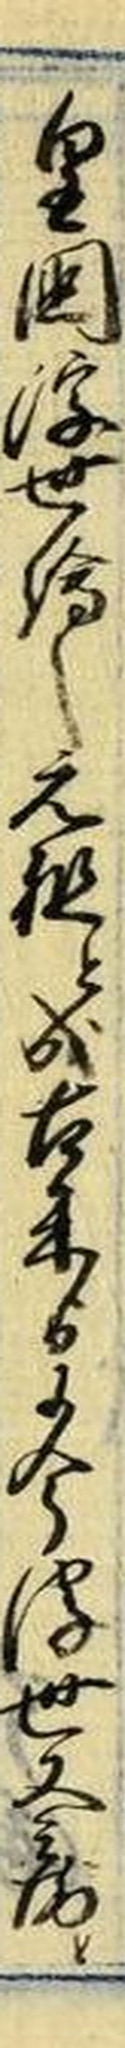皇国浮世絵之元祖と成古来ゟ于今浮世又兵衛と
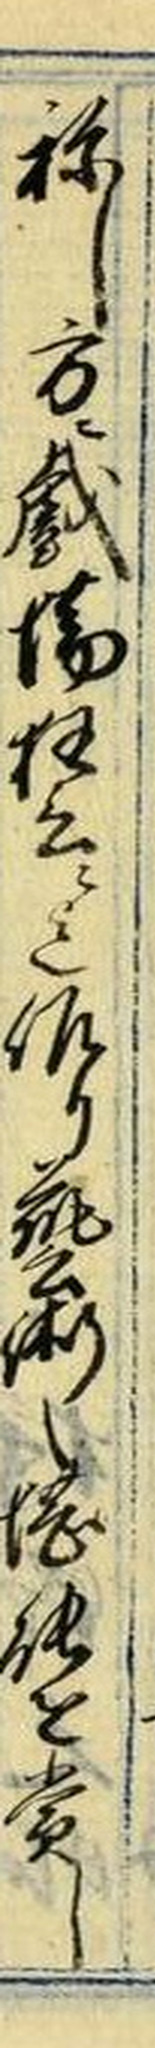称し方に戯場狂言に迄作り芸術之堪能を賞し
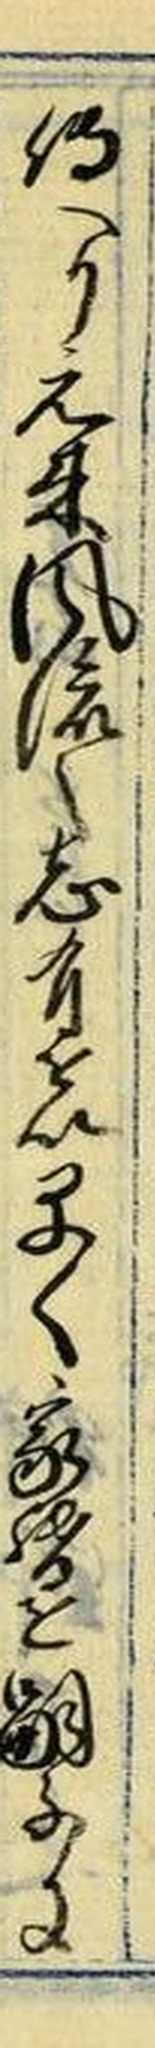伝へり元来風流之志有を以早く家督を嗣子に
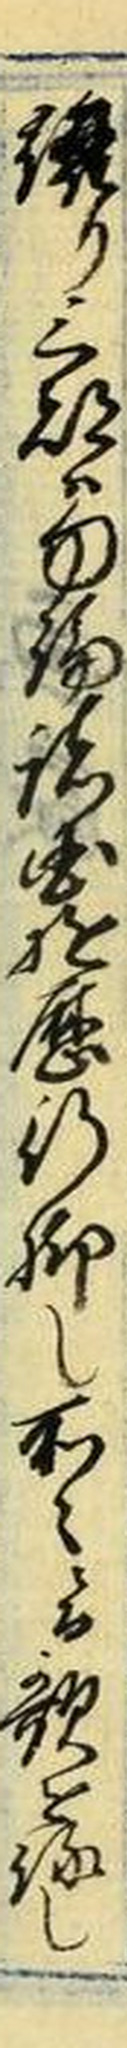譲り三都は勿論諸国遊歴行脚し所々に而歌を詠し
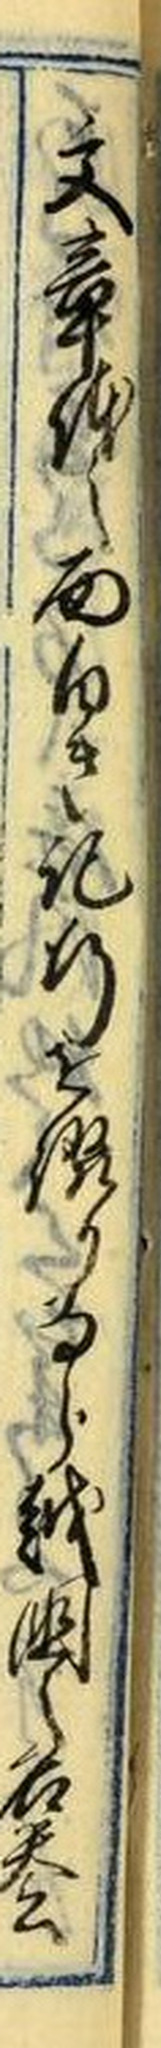文章体之面白き紀行を綴り専ら越国之名誉
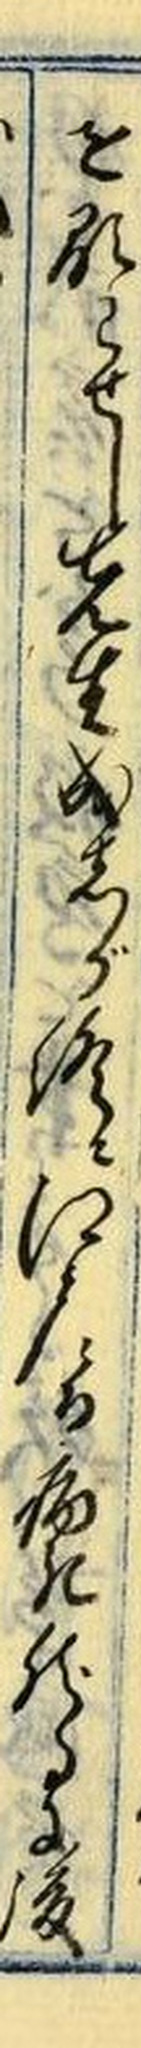を顕わせし先生成しが終に江戸に而病死然るに後
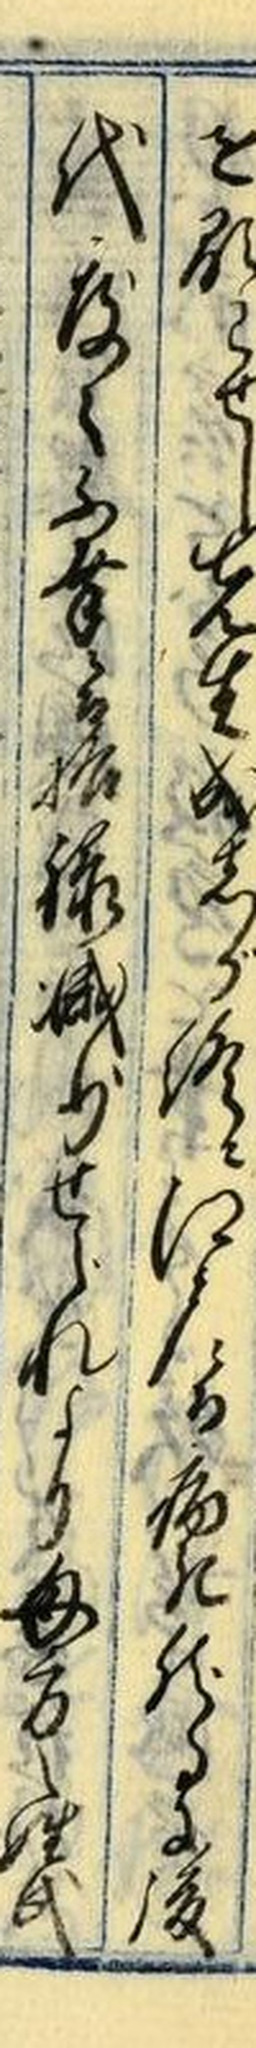代度々不幸に而格禄減少せられより母方之姓氏
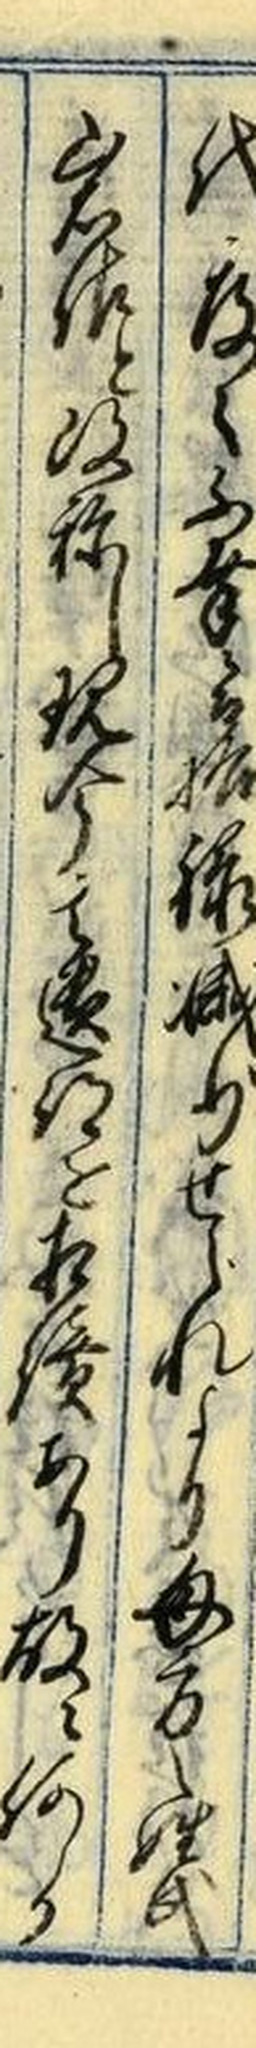岩佐と改称し現今其遺跡を相続あり故に何か
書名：温古集 四巻
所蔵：福井県文書館 Fukui Prefectural Archives
